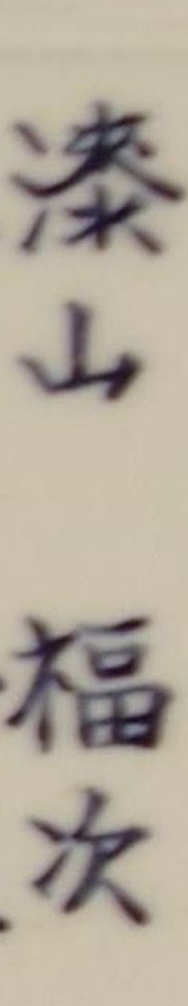漆山福次
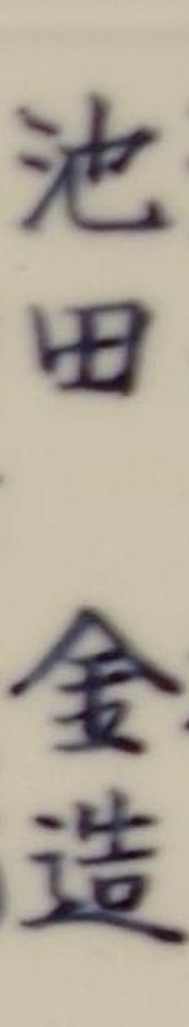池田金造
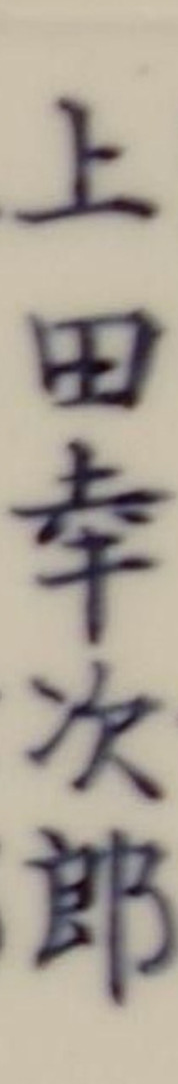上田幸次郎
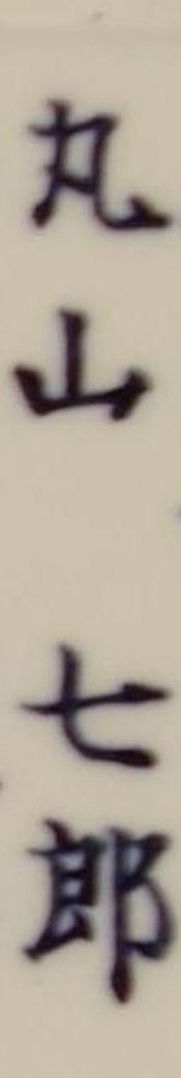丸山七郎
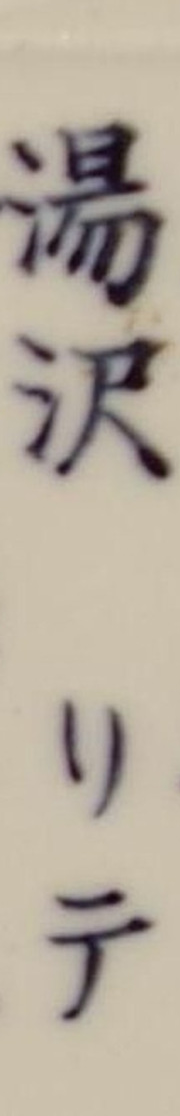湯沢リテ
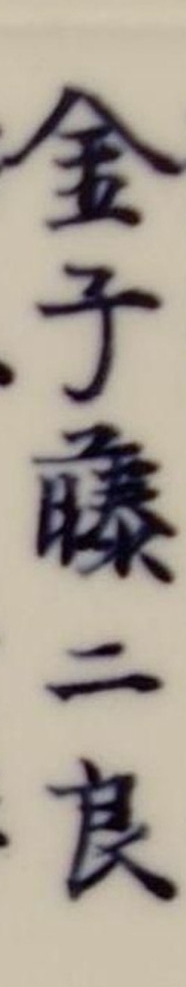金子藤二良
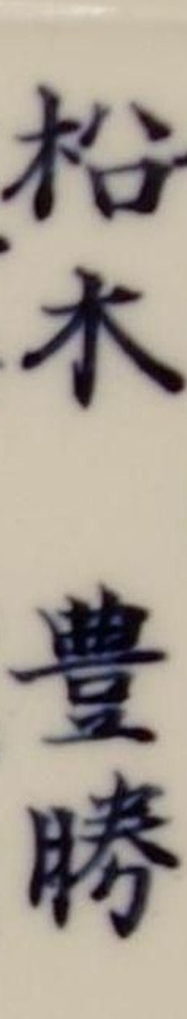松木豊勝
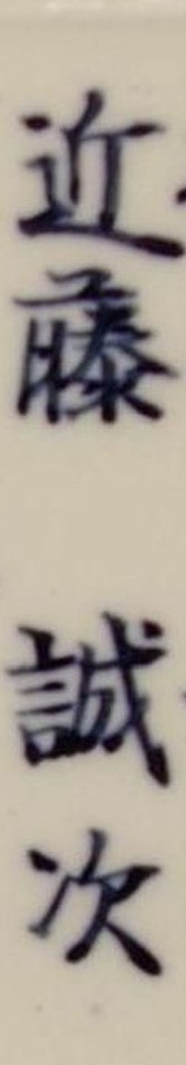近藤誠次
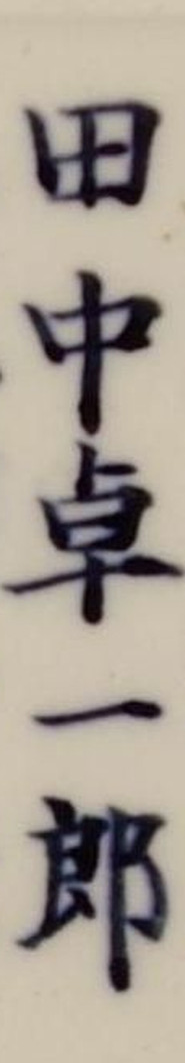田中卓一郎
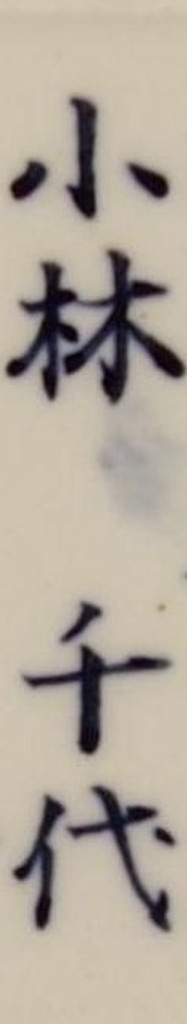小林千代
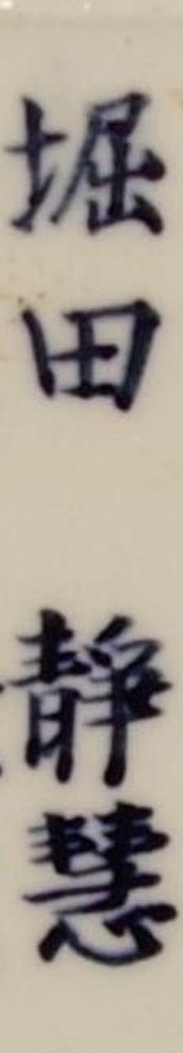堀田静慧
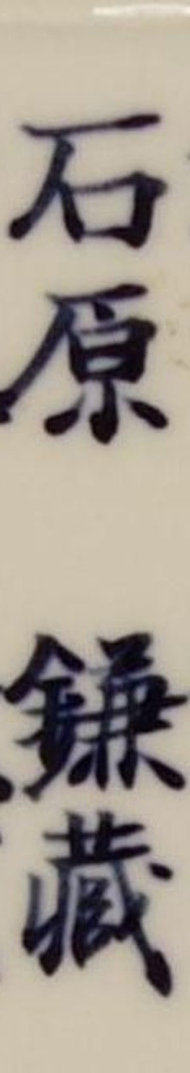石原鎌蔵
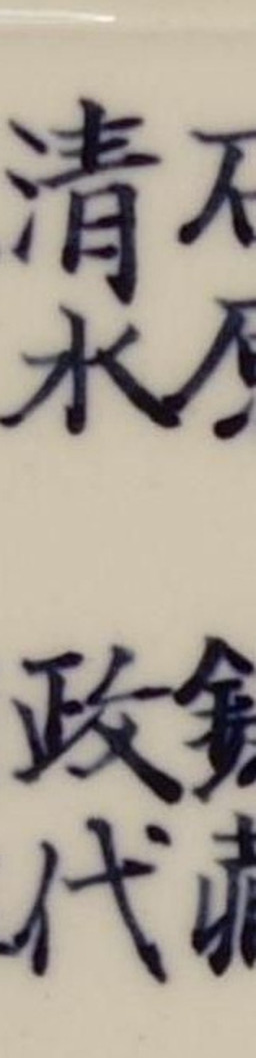清水政代
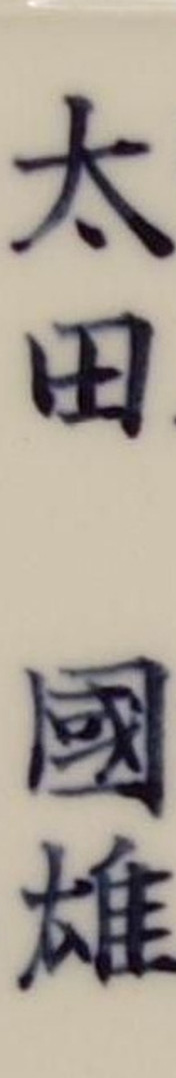太田国雄
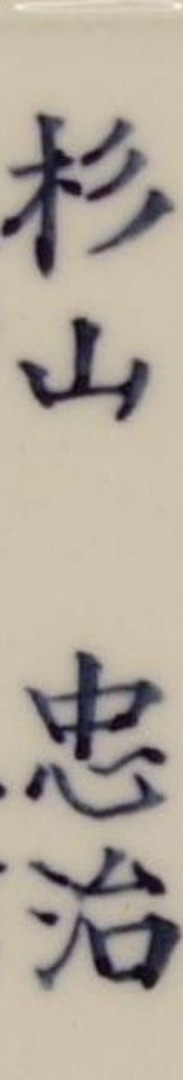杉山忠治
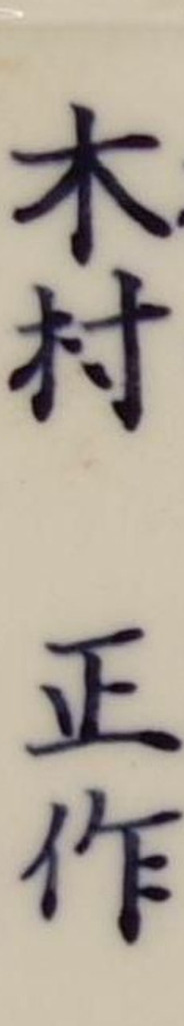木村正作
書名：M~S
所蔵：高野山金剛峯寺
